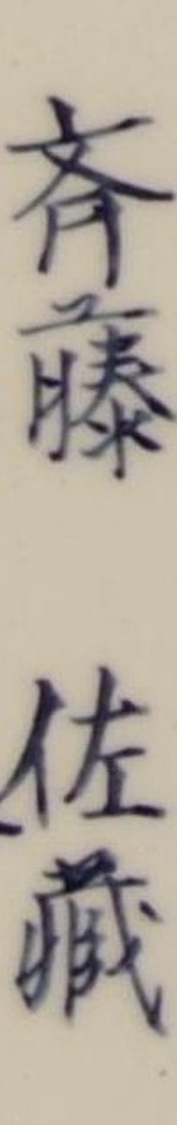斉藤佐蔵
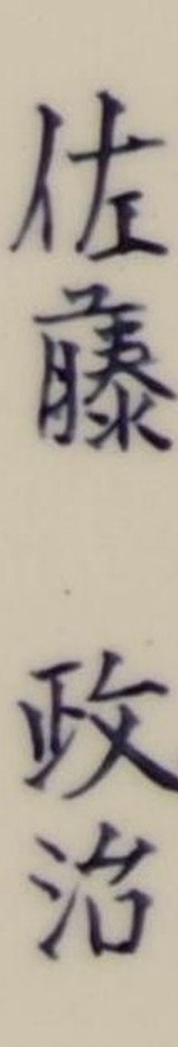佐藤政治
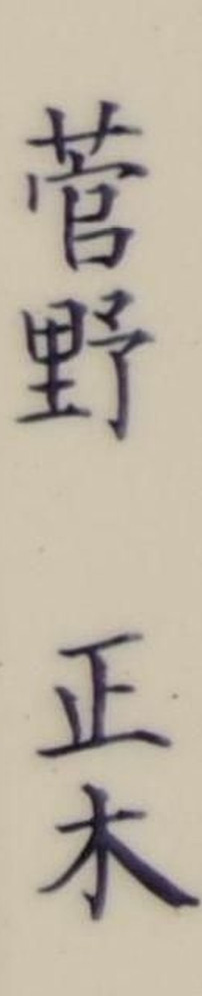菅野正木

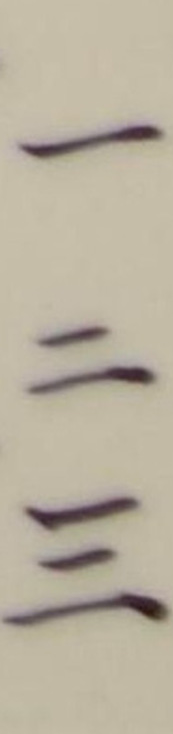一二三
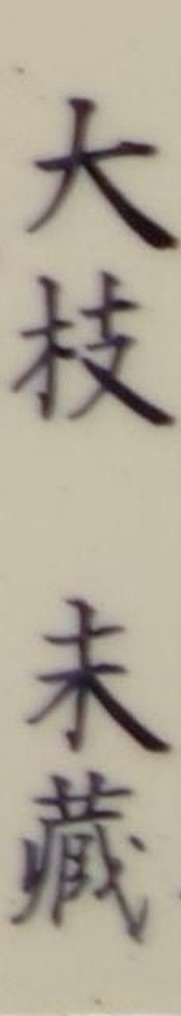大枝末蔵
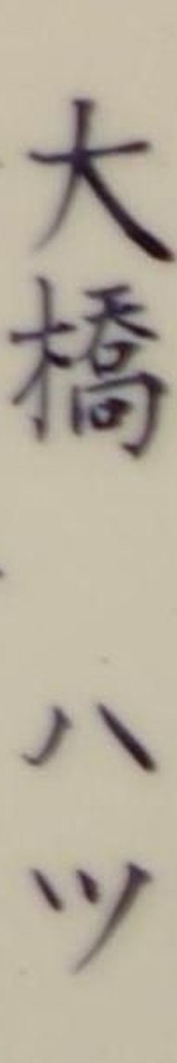大橋ハツ
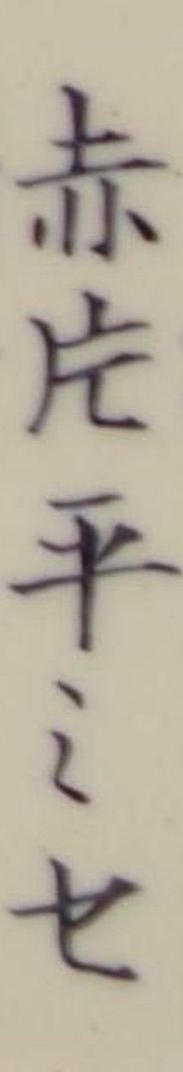赤片平みせ
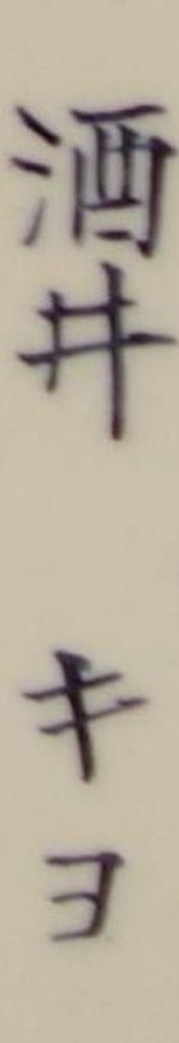酒井キヨ
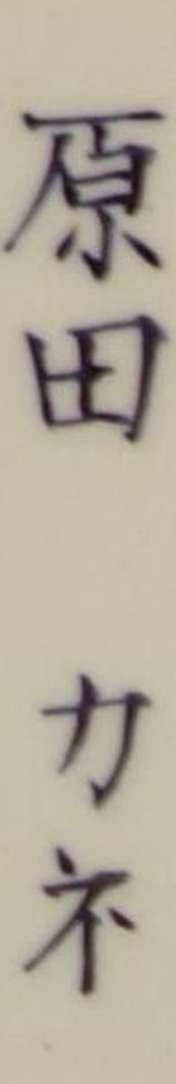原田力ネ
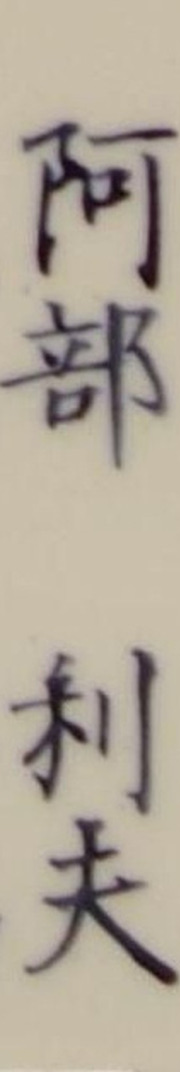阿部利夫
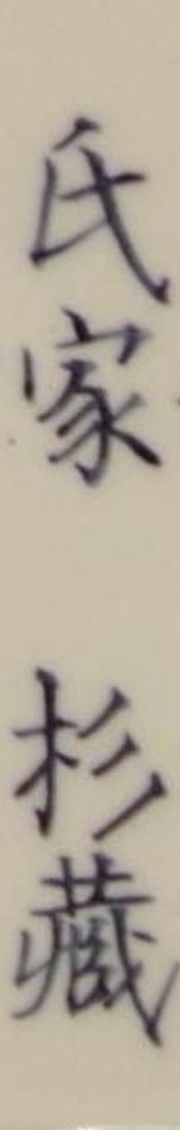氏家杉蔵
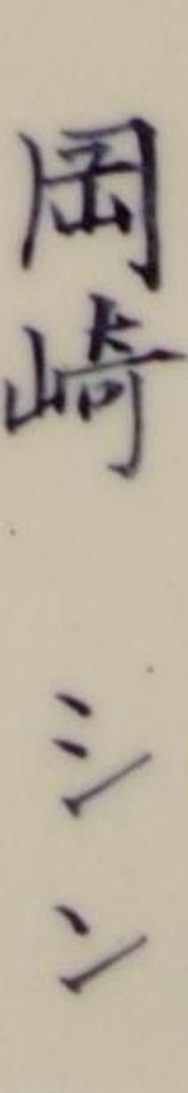岡崎シン
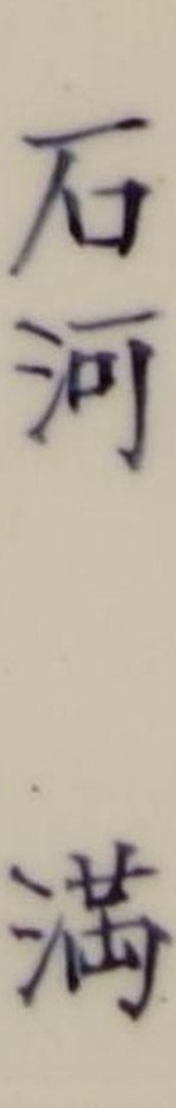石河満
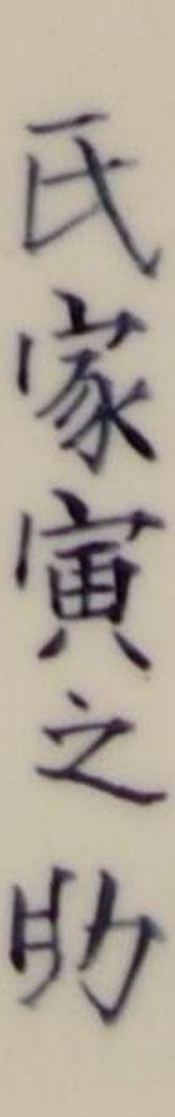氏家寅之助
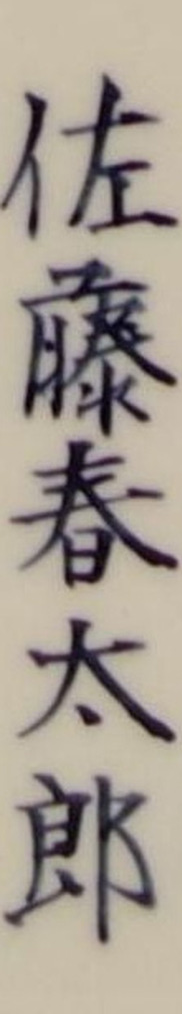佐藤春太郎
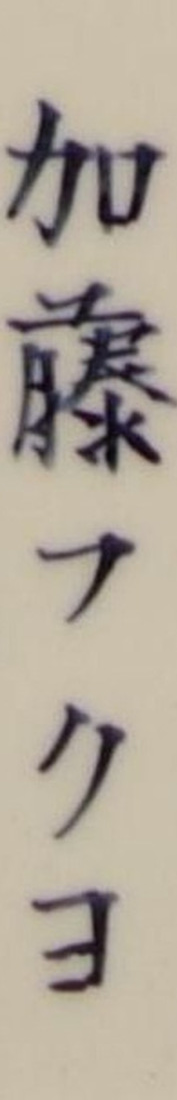加藤フクヨ
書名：M~S
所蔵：高野山金剛峯寺
